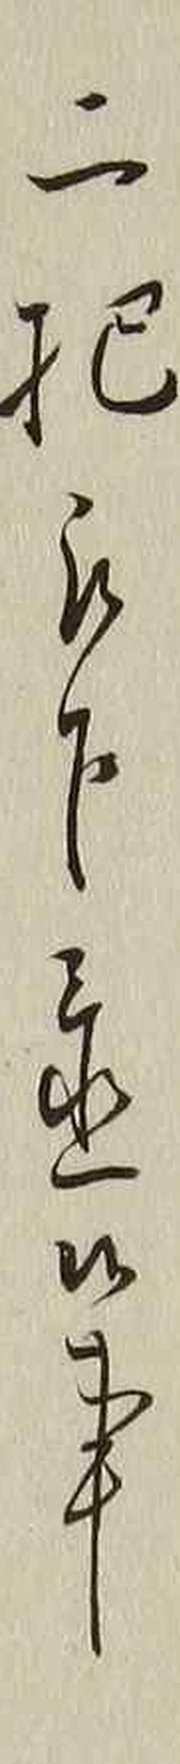二把被下置候事
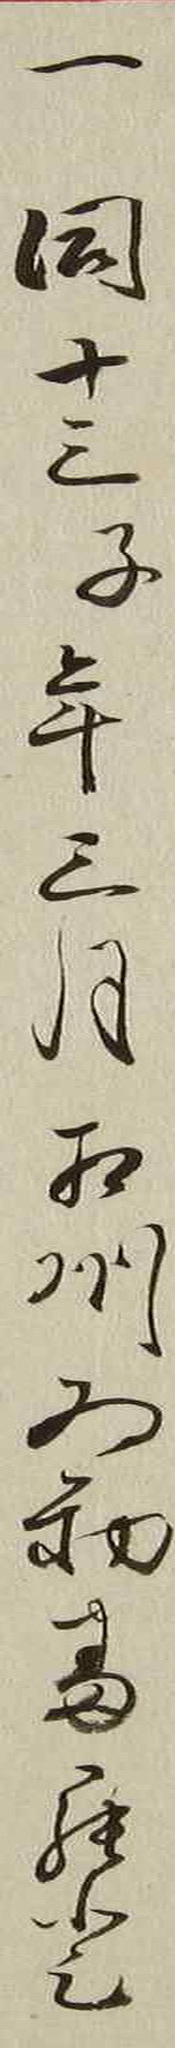一同十三子年三月相州為勤番罷登
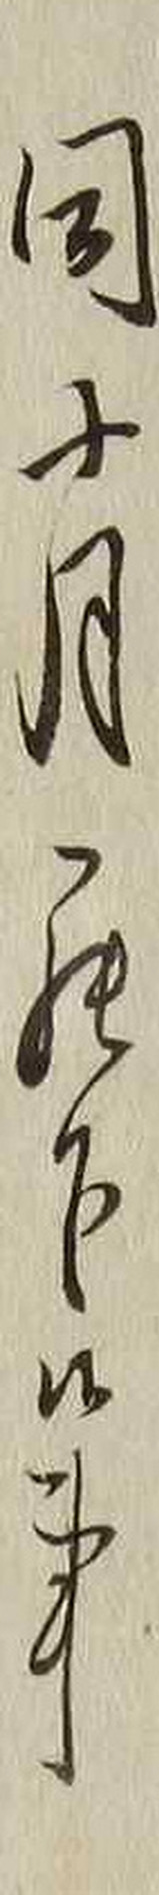同十月罷下候事
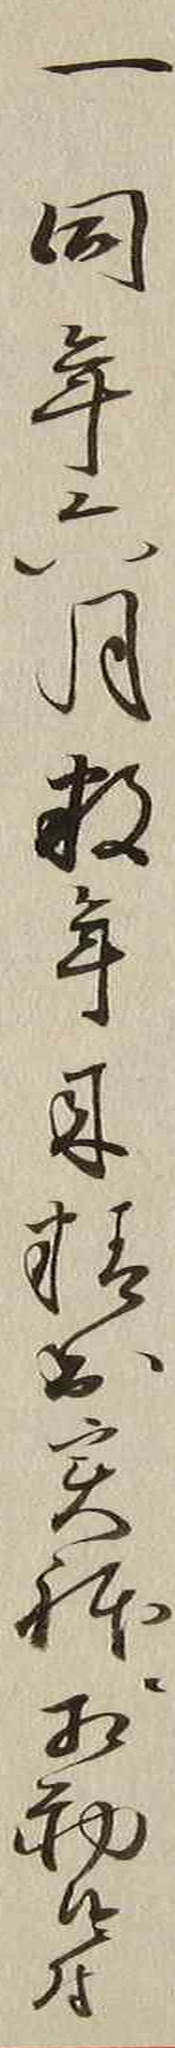一同年六月数年来精出実体ニ相勤候ニ付
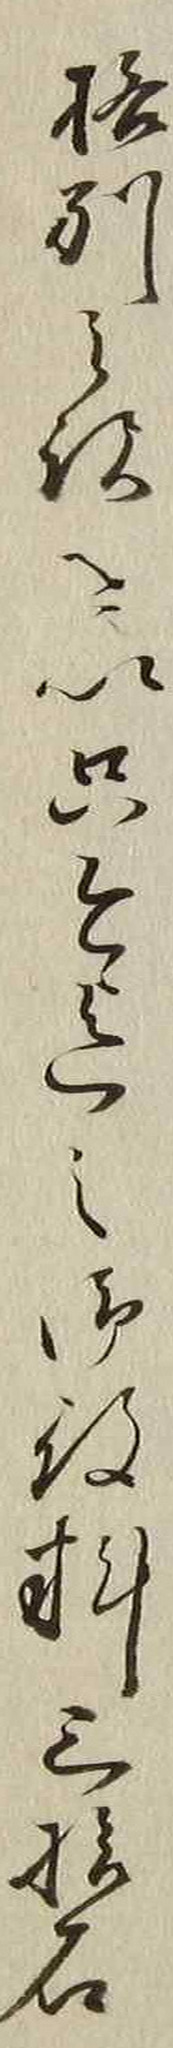格別之訳を以只今迄之御役料三拾石
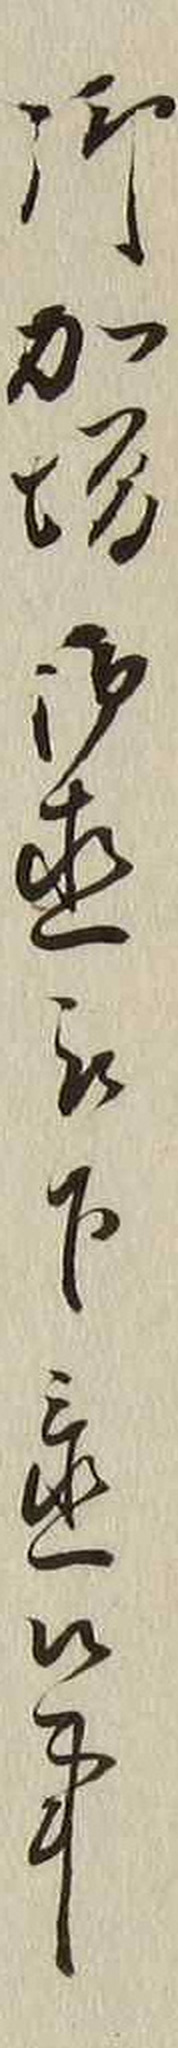御加増御直被下置候事
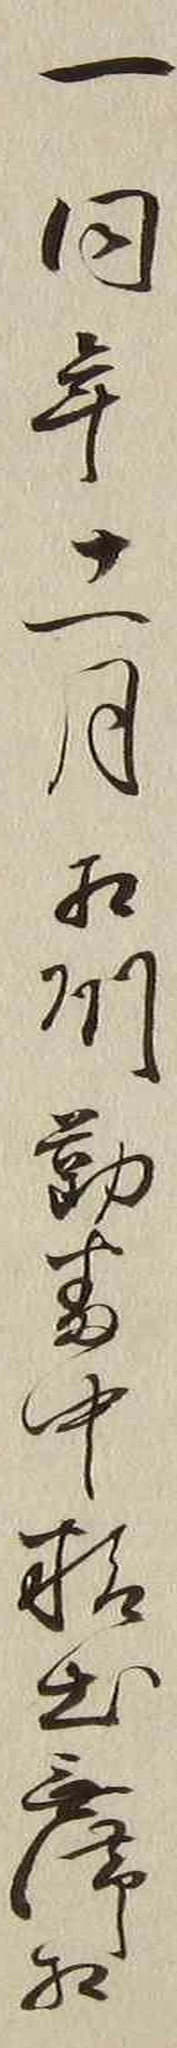一同年十一月相州勤番中精出無滞相
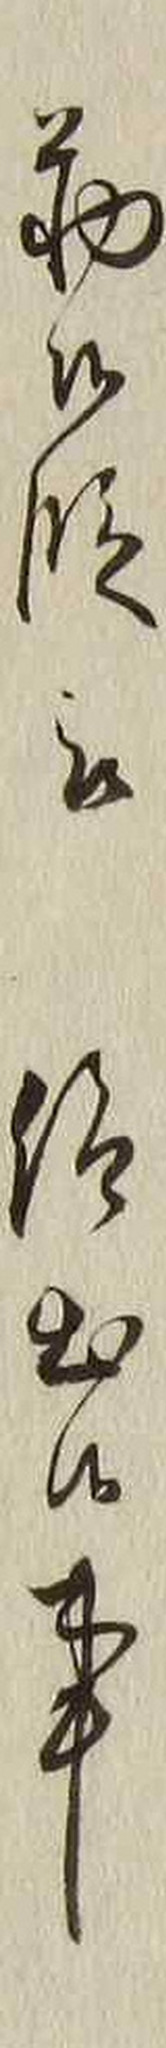勤候段被仰出候事
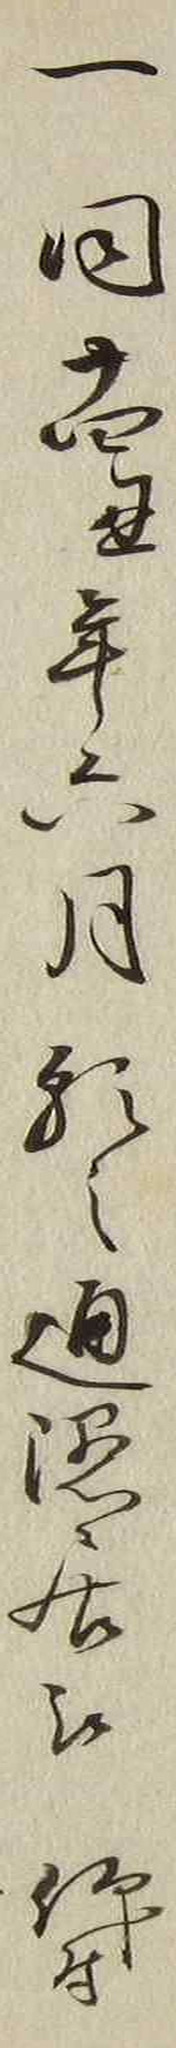一同十四丑年六月願之通隠居被仰付
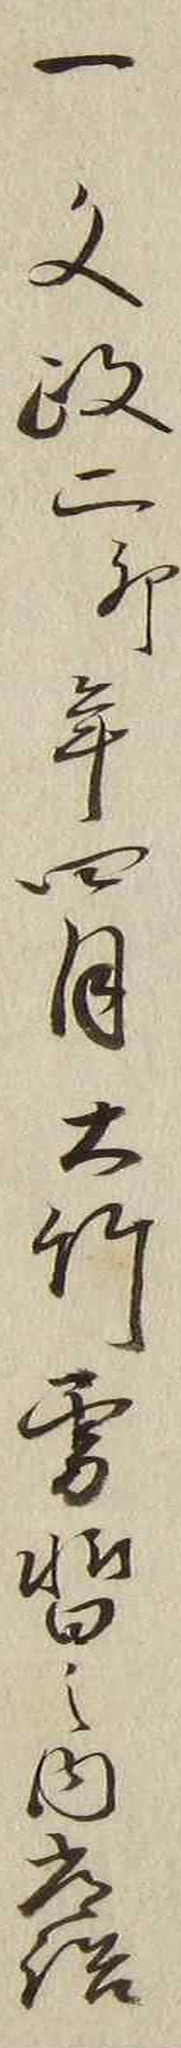一文政二卯年四月大竹暫之内常詰
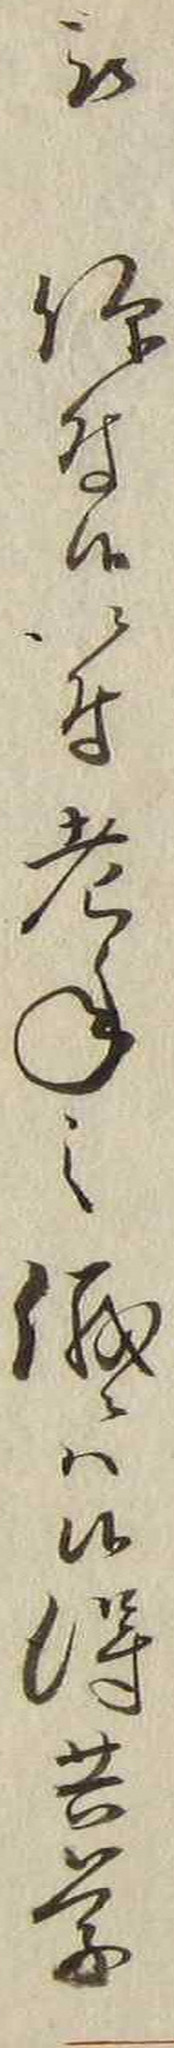被仰付候ニ付老年之儀ニハ候得共学

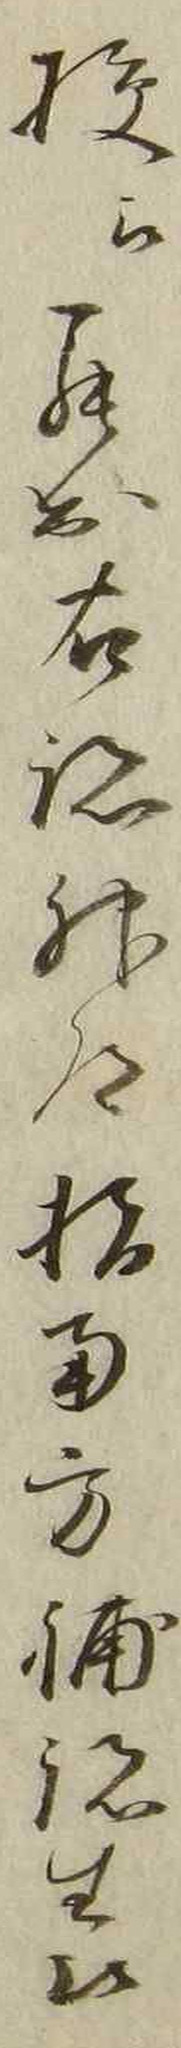授江罷出右跡神道指南方補跡生被
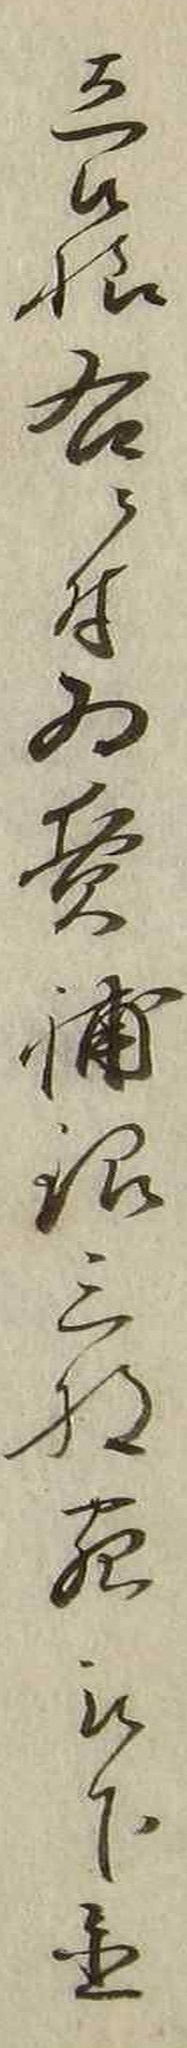立候様右ニ付為費補銀三枚宛下置
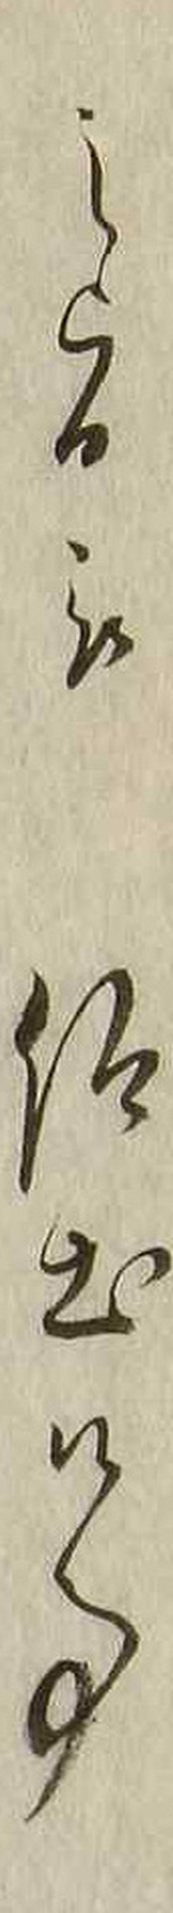之旨被仰出候事
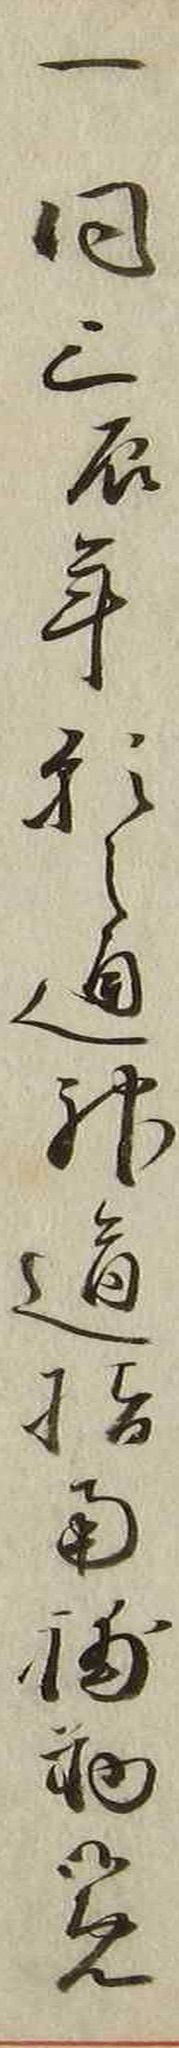一同三辰年願之通神道指南補勤御免
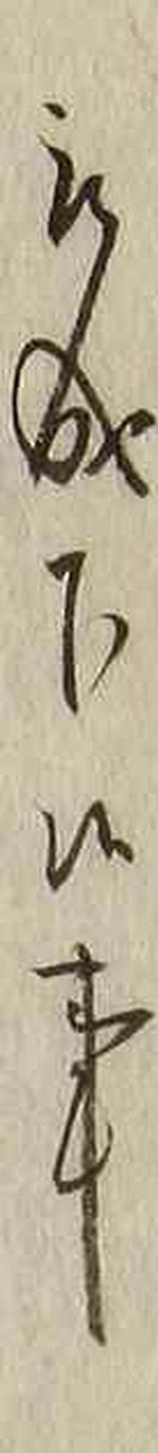被成下候事
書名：諸士系譜　巻之25　い之部25
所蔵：会津若松市立会津図書館
